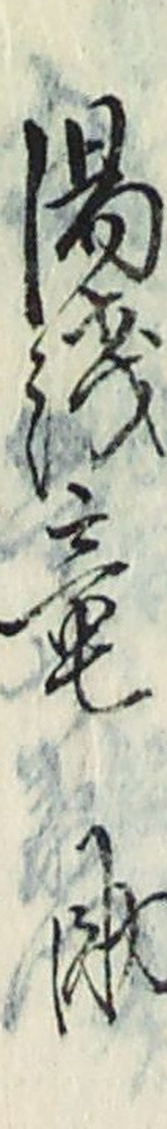湯浅竜助
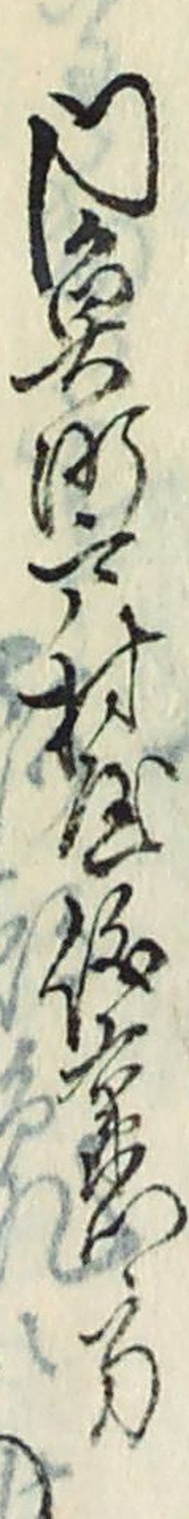内魚町戸村屋儀右衛門方
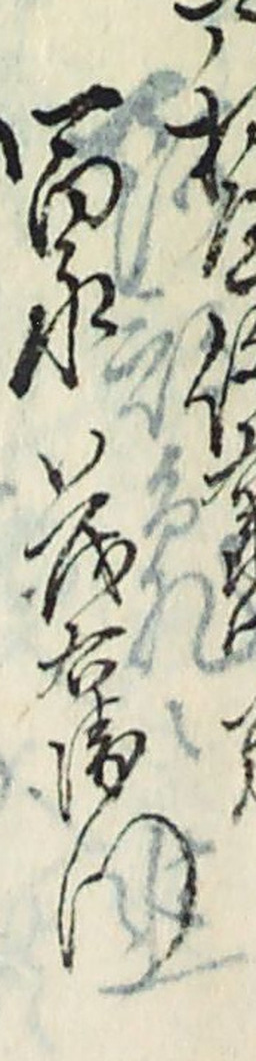冨永茂右衛門
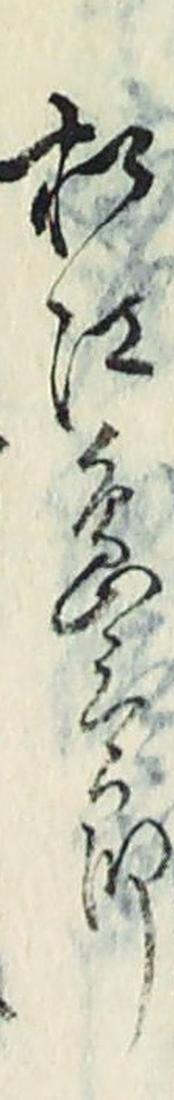松江嶋三郎
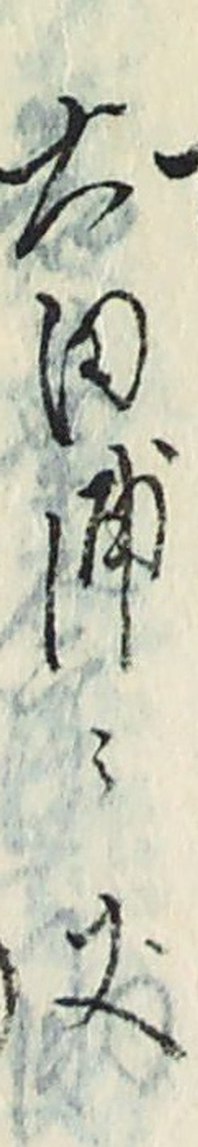大田浦之丈
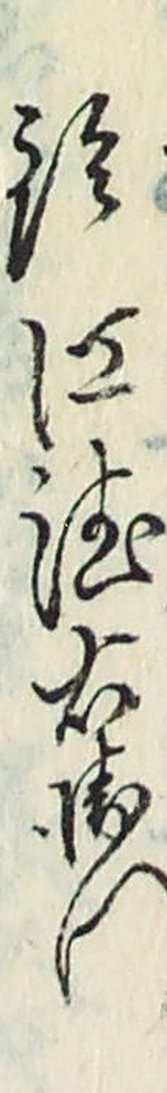鈴江徳右衛門
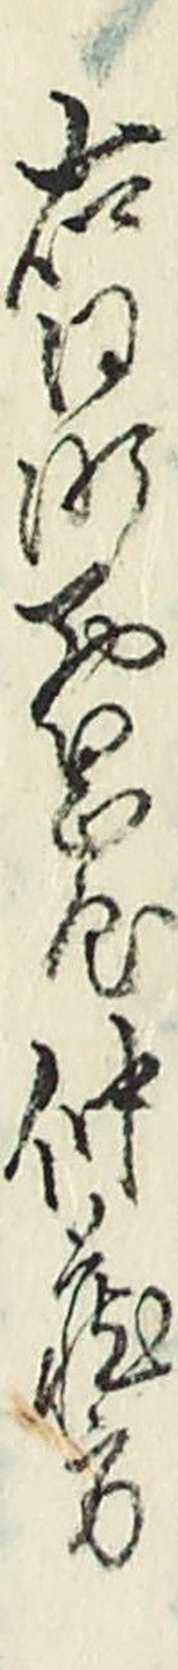右同町西岡屋仲蔵方
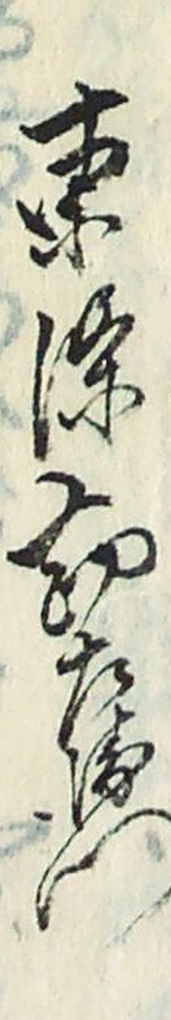東條勘左衛門
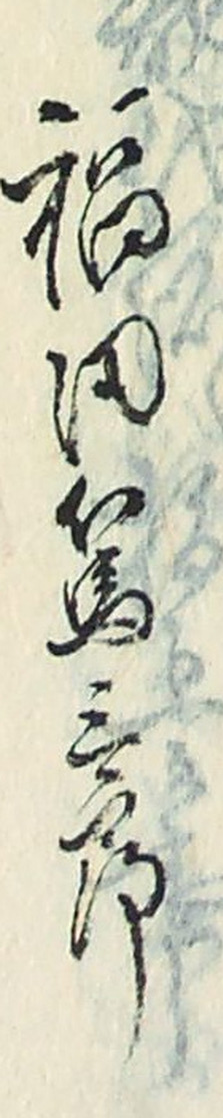福田篤三郎
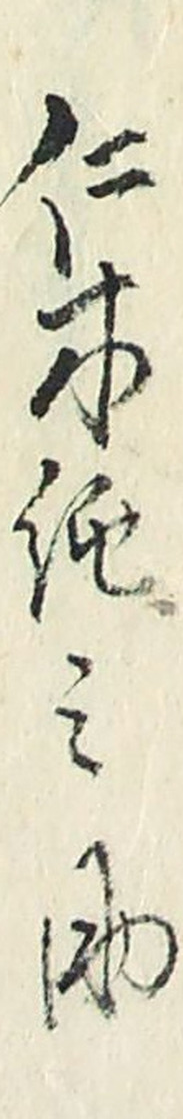仁木純之助
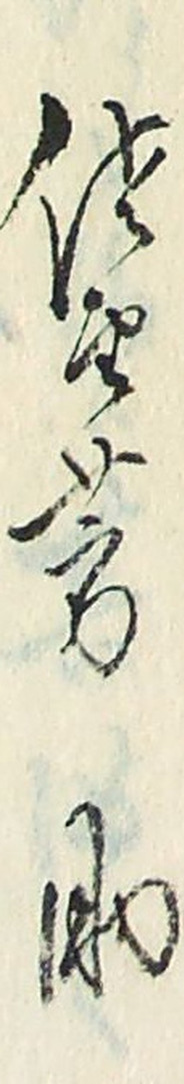佐野芳助

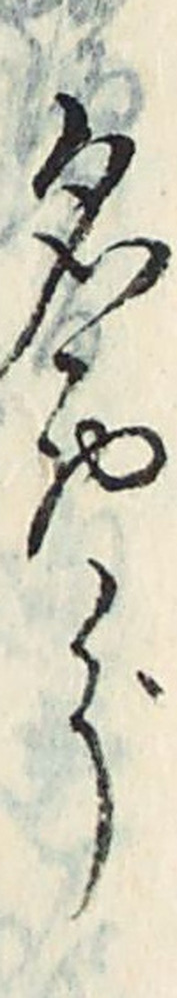名西分
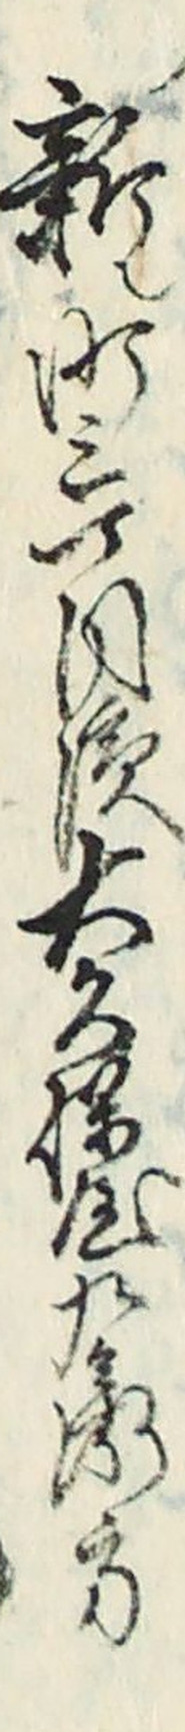新シ町三丁目濱大久保屋九兵衛方
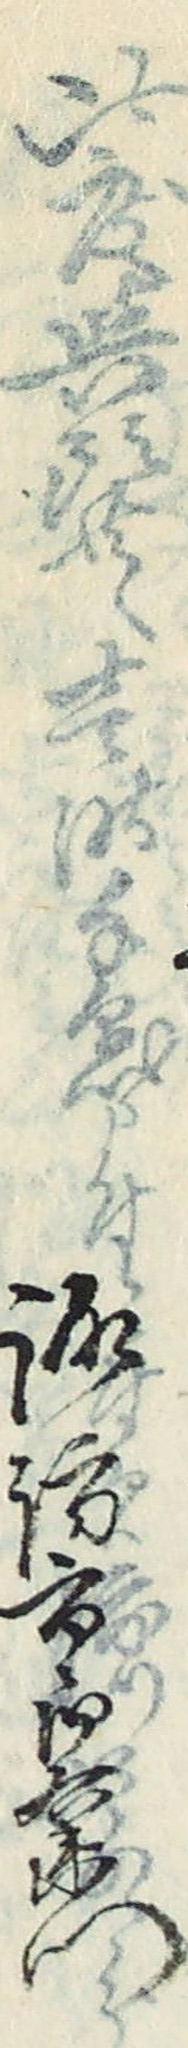諏訪市郎右衛門
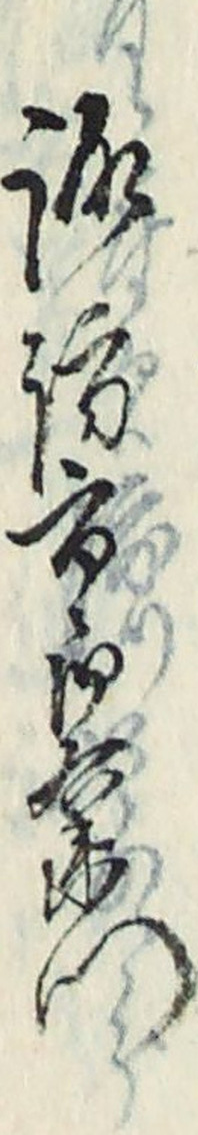諏訪市郎右衛門
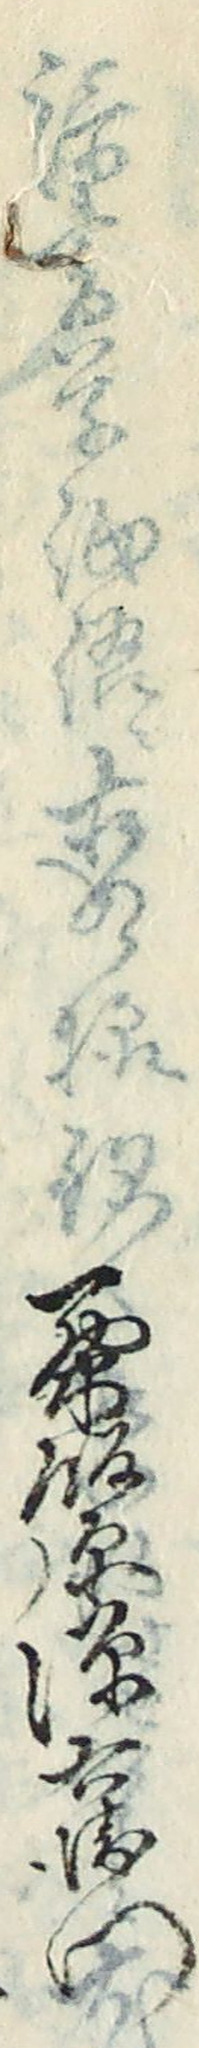粟飯原源右衛門
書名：諸御趣意書并御下知向之写
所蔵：鳴門教育大学 Naruto University of Education
